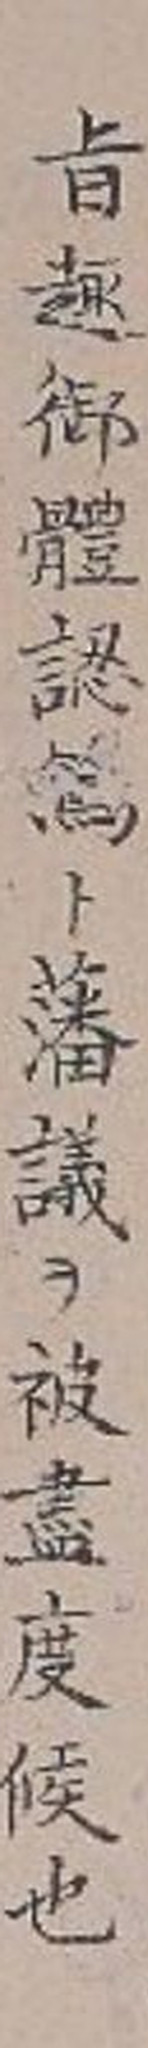旨趣御体認篤ト藩議ヲ被尽度候也
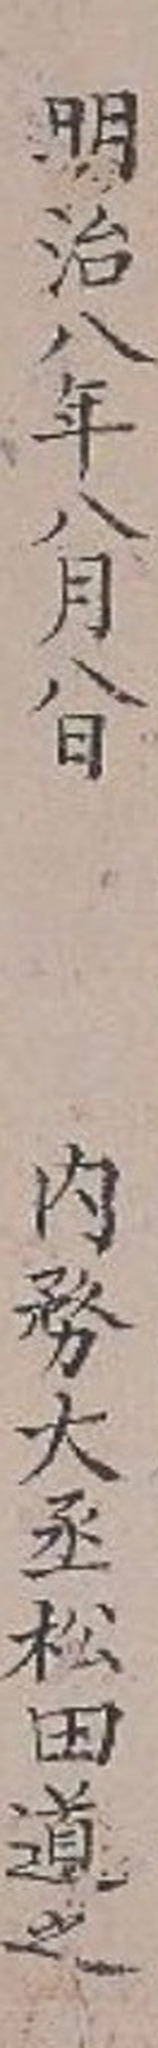明治八年八月八日内務大丞松田道之
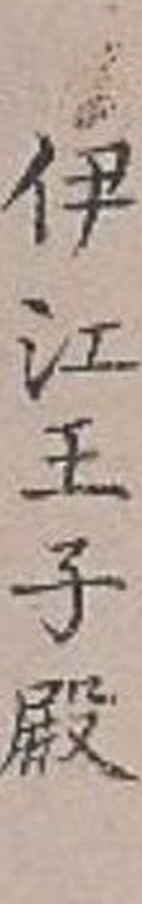伊江王子殿
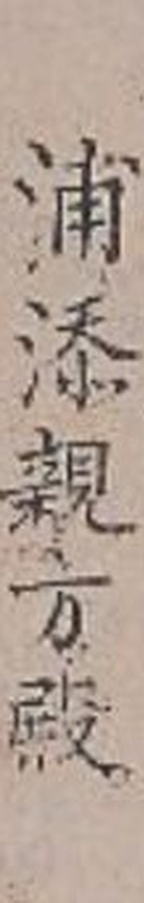浦添親方殿
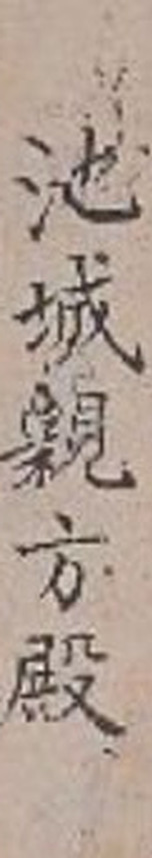池城親方殿
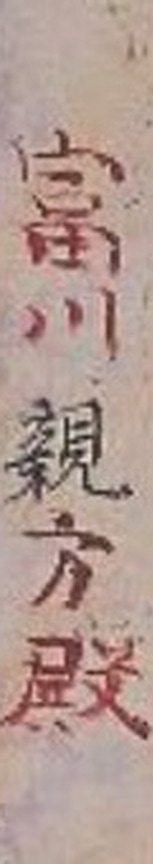浦添親方殿

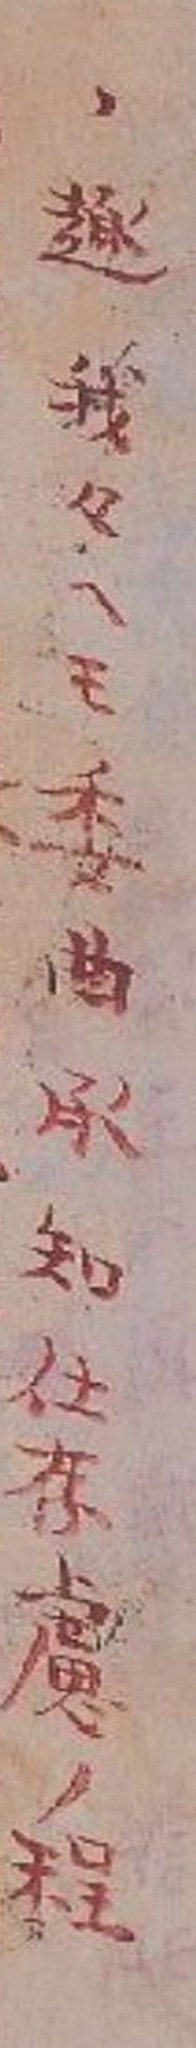ノ趣我々ヘモ委曲承知仕存慮ノ程
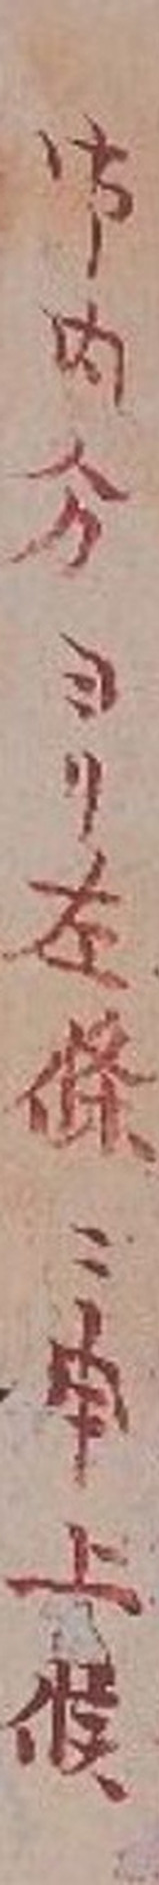御内分ヨリ左条ニ申上候
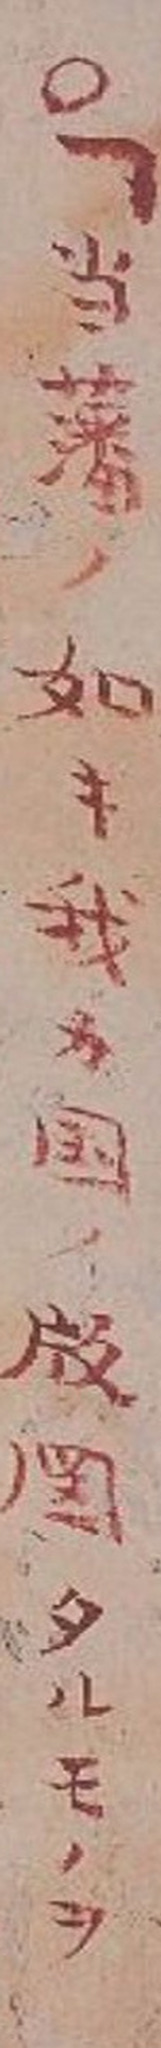〇「当藩ノ如キ我カ国ノ版図タルモノヲ
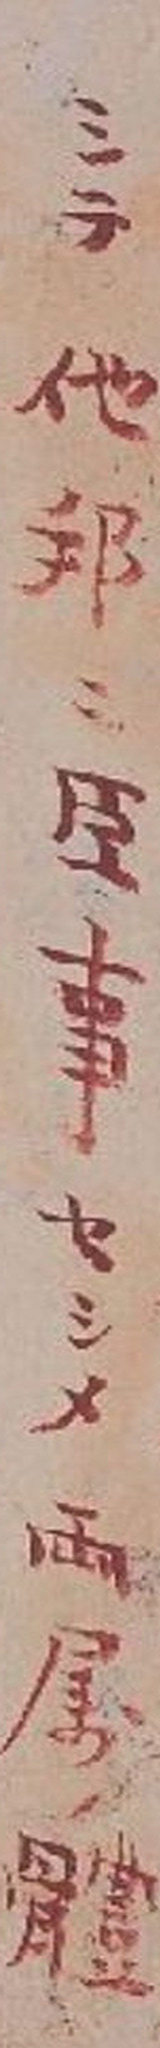シテ他邦ニ臣事セシメ両属ノ体
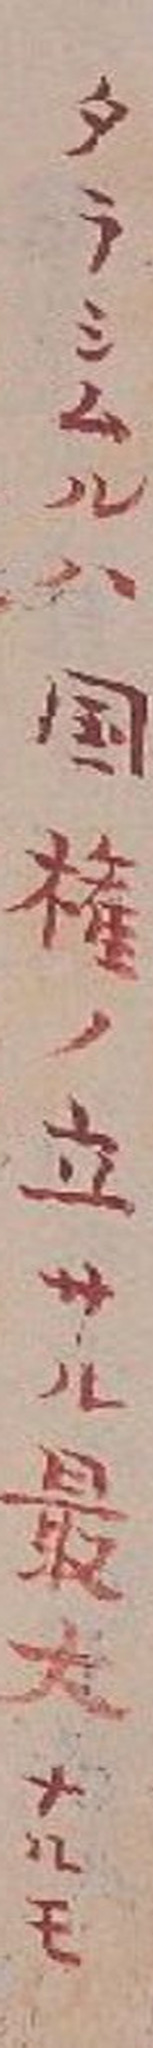タラシムルハ国権ノ立サル最大ナルモ
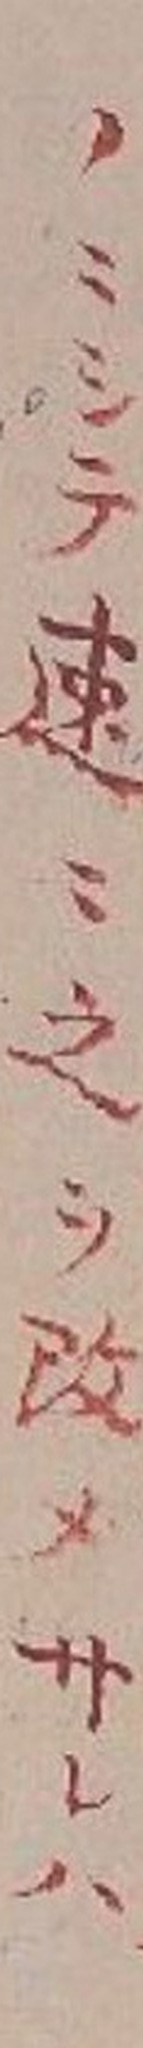ノニシテ速ニ之ヲ改メサレハ
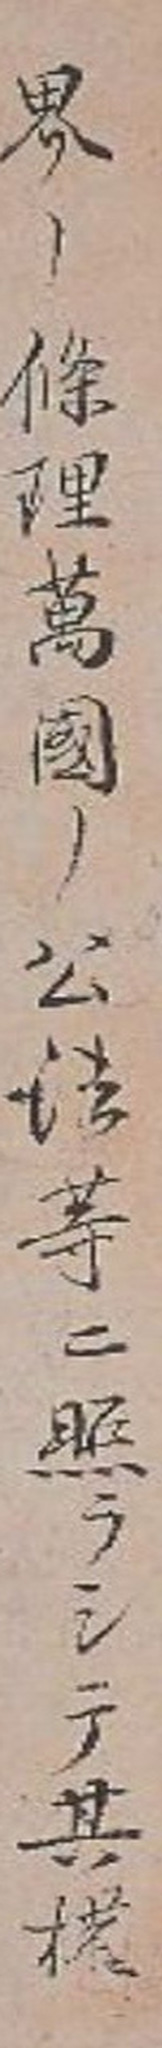界ノ条理万国ノ公法等ニ照ラシテ其権
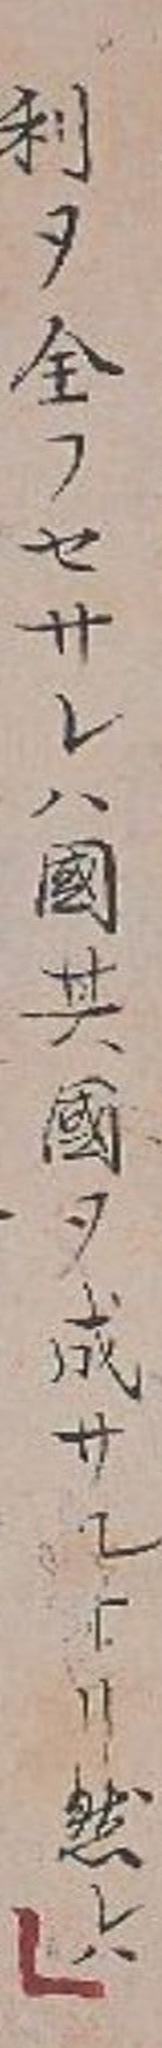利ヲ全フセサレハ国其国ヲ成サルナリ然レハ」
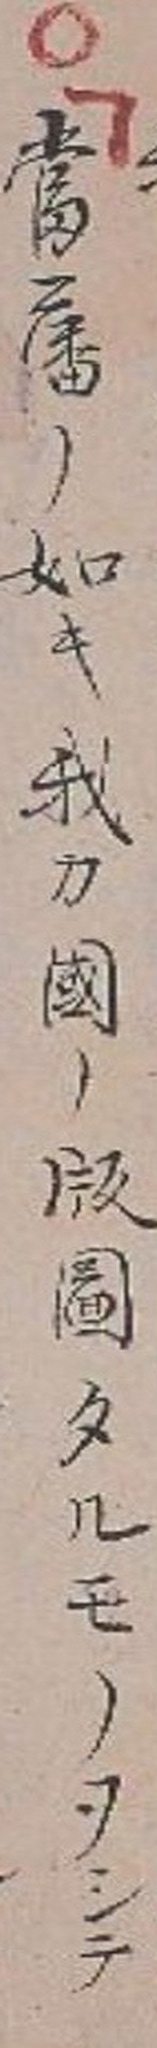〇「当藩ノ如キ我カ国ノ版図タルモノヲ
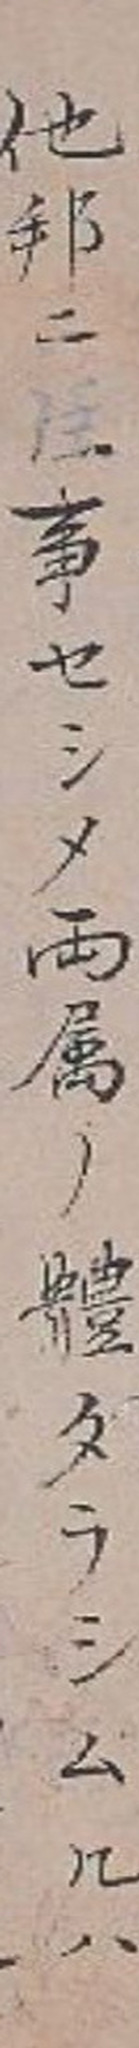他邦ニ臣事セシメ両属ノ体タラシムルハ
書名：奉使琉球始末 草稿之一部
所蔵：University of the Ryukyus Library
